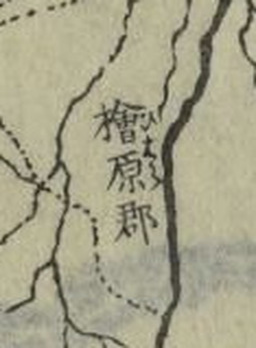檜原郡
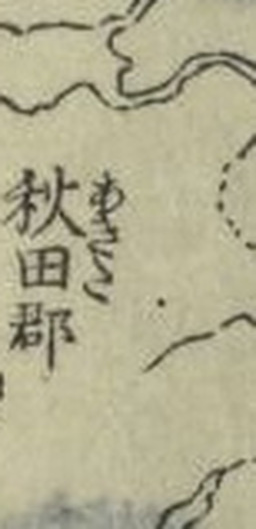秋田郡
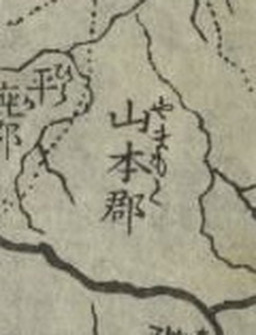山本郡
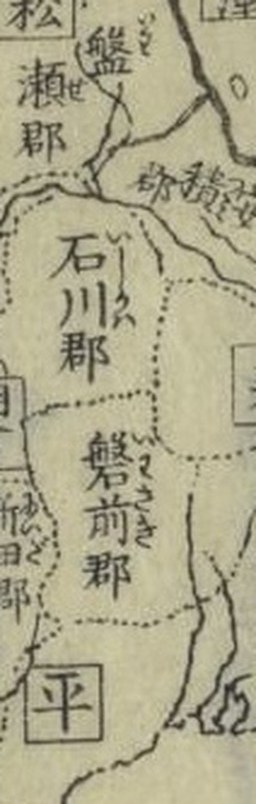石川郡磐前郡
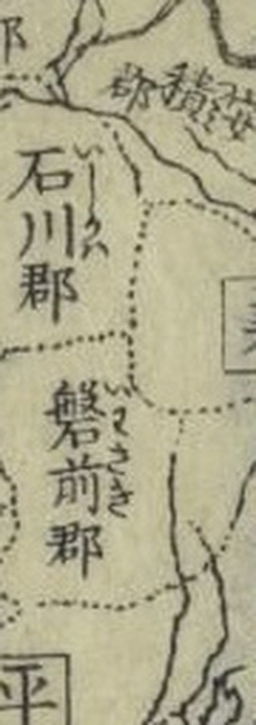石川郡磐前郡

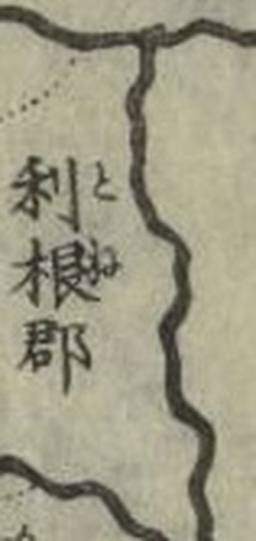利根郡
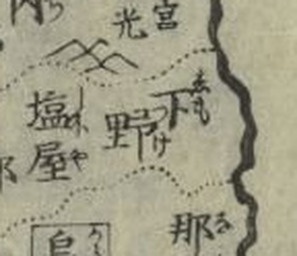鹿島郡
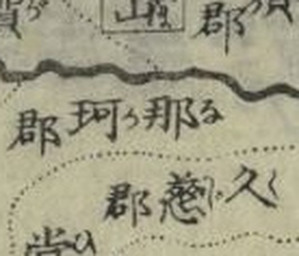那珂郡
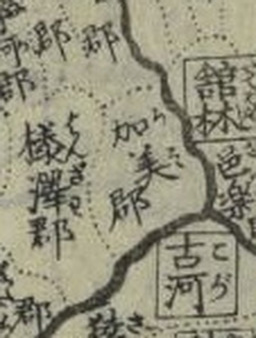加美郡
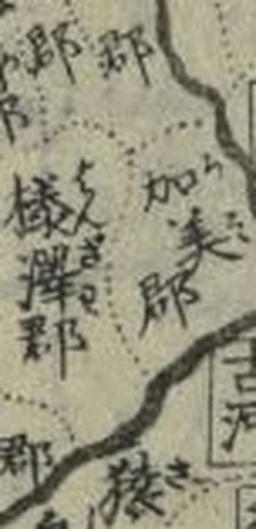君澤郡
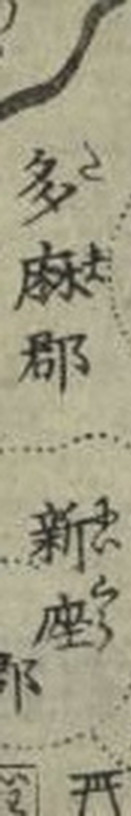多摩郡新座郡
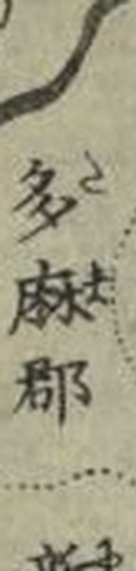多胡郡
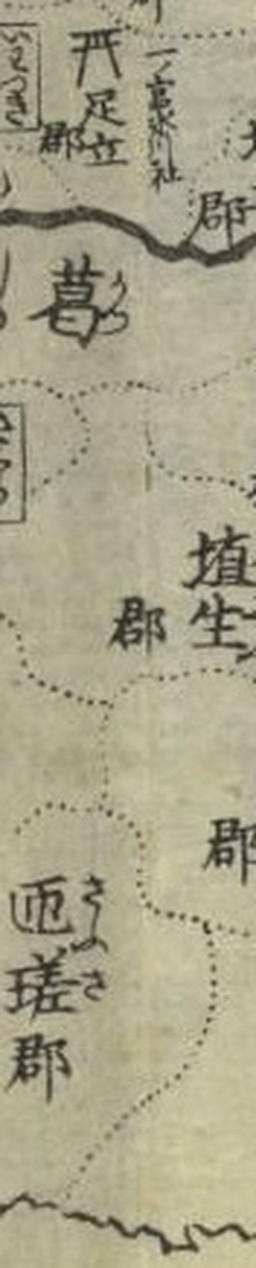匝瑳郡
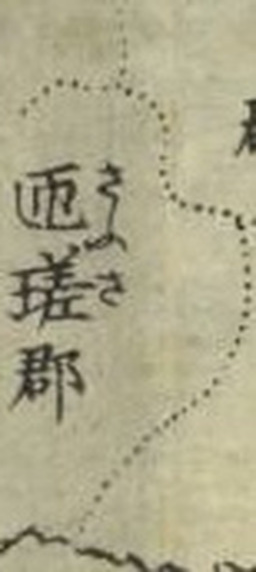匝瑳郡
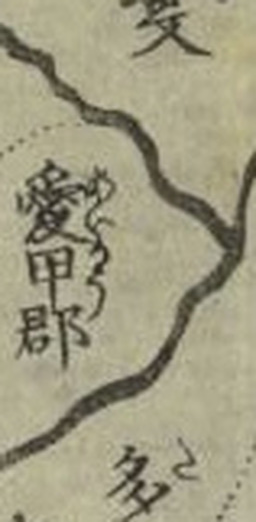愛甲郡
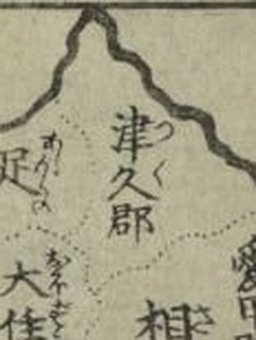津久郡
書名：大日本分境図成
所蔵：University of the Ryukyus Library
